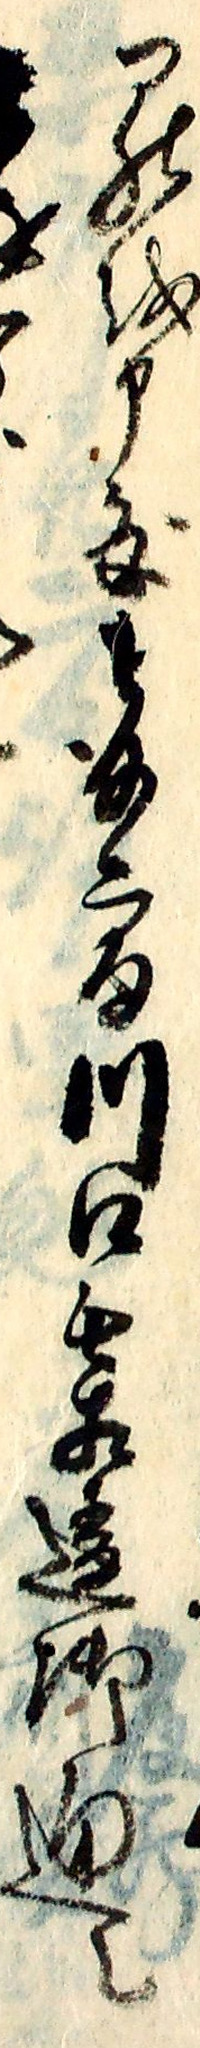罷越申度奉存候間川口無相違御通し
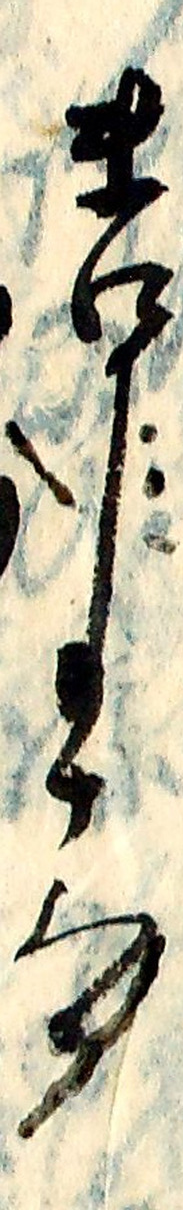未四月十三日
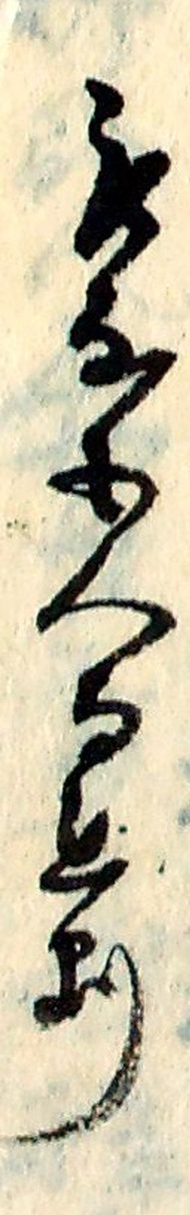庄屋五人与連判

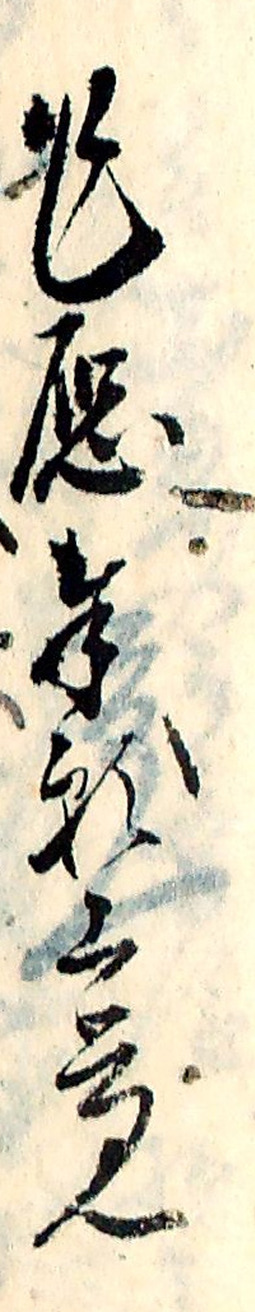乍恐奉願上覚
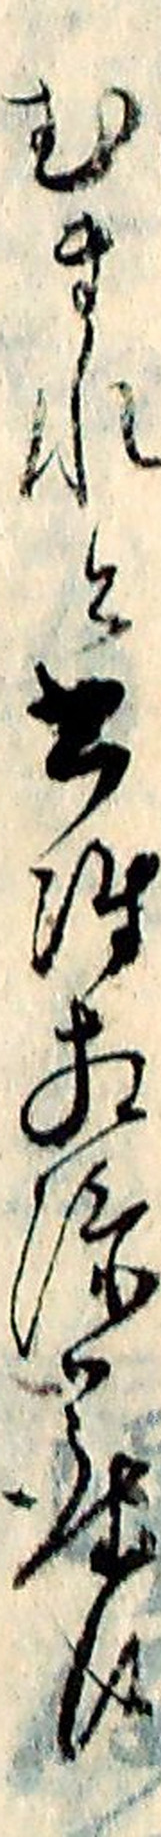むまれと書附相添御座候
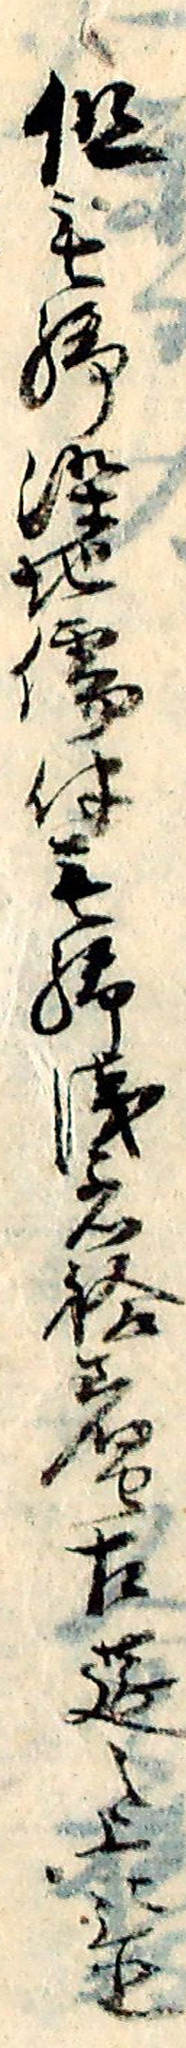但無綿染地襦袢無綿浅葱袷着せ古筵之上に置
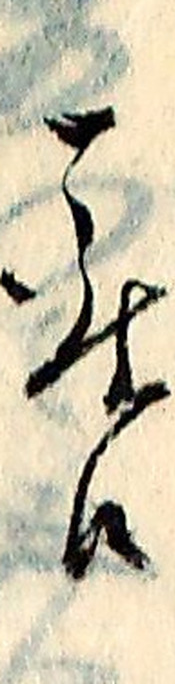御座候
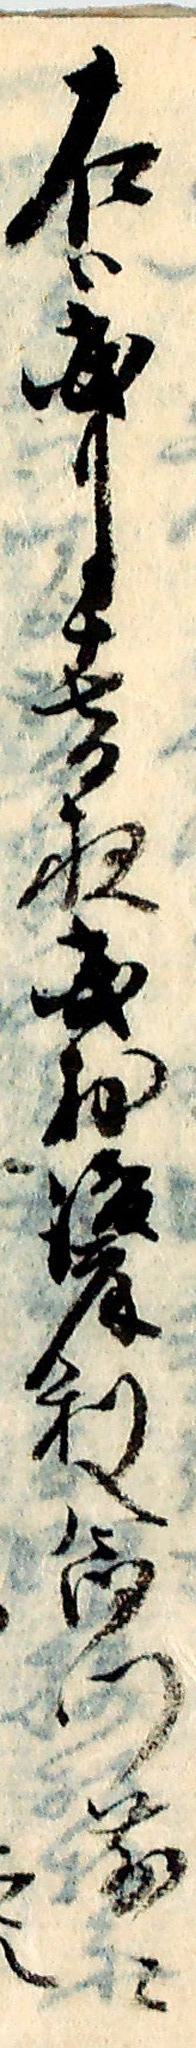右は当月十七日夜当村後藤利八郎門前に
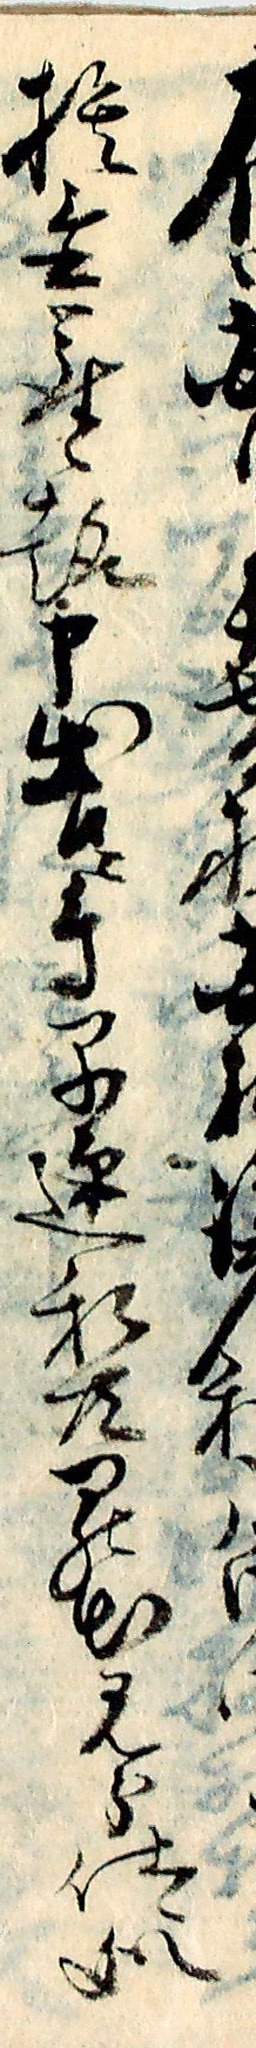捨置御座候趣申出候に付早速私共罷出見分仕候処
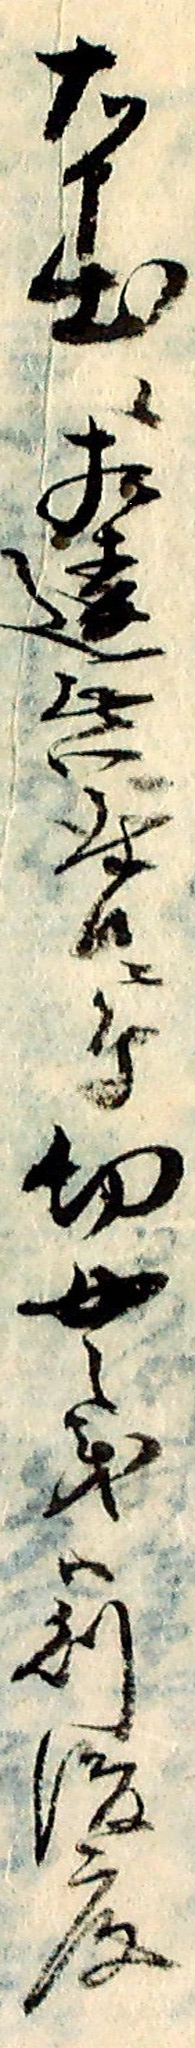右申出に相違無御座候に付幼女之義は則後藤
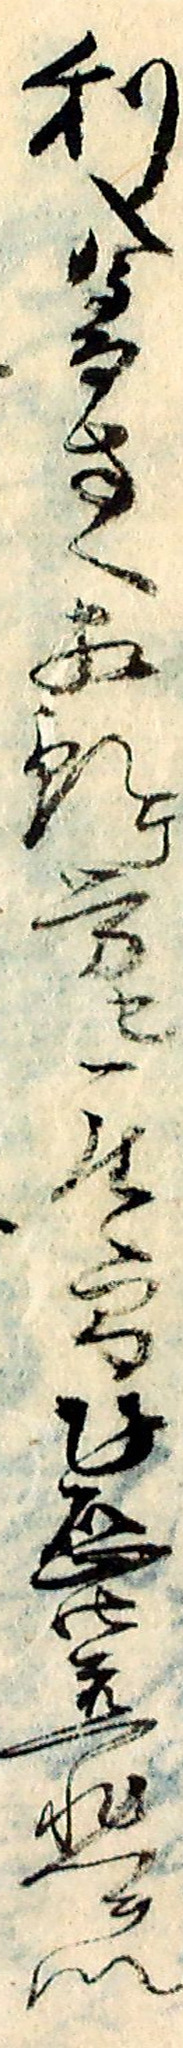利八郎方へ相預け労せ置候間乍恐御慈悲を以
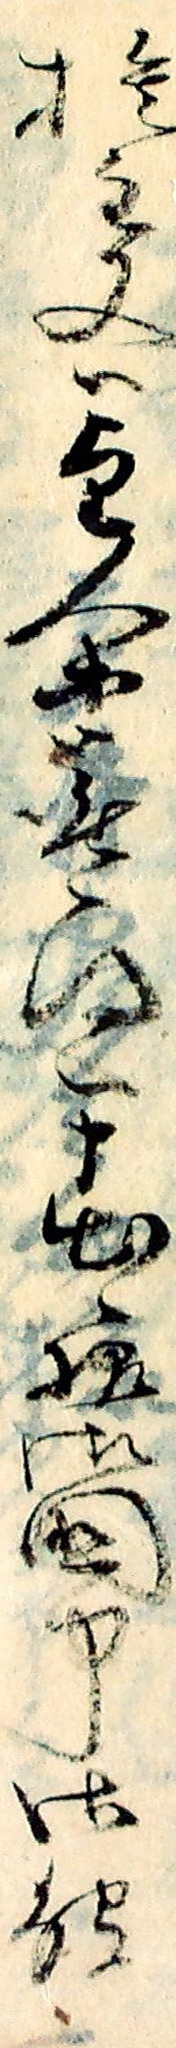捨主又は望人等御座候得は申出候様御国中御触
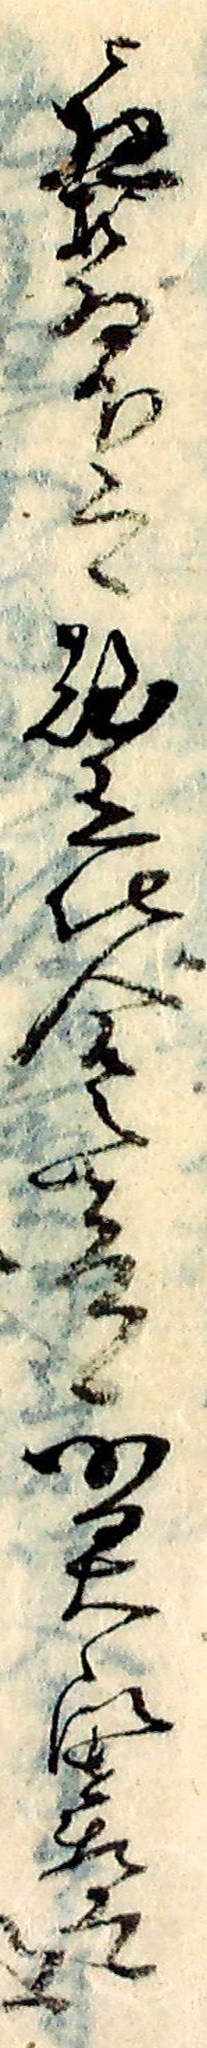被遊被為下候はゝ難有仕合に奉存候仍て右之段奉願上候
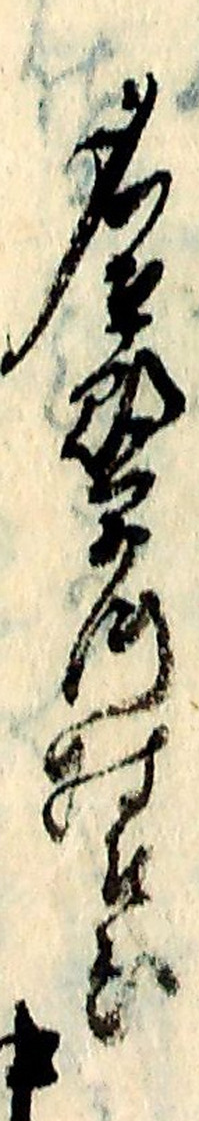名東郡早淵村庄屋
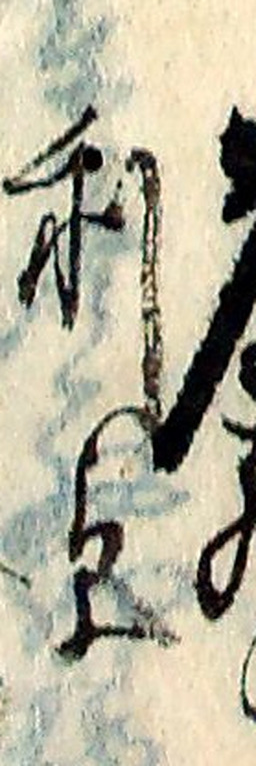利兵衛
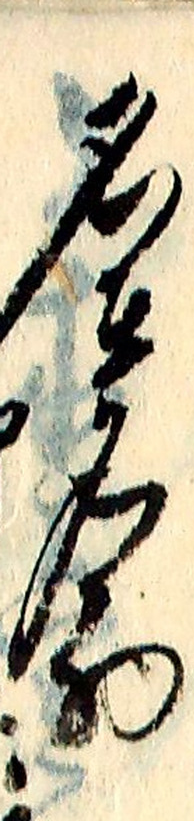名東名西
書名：諸御願書控(後藤氏壱番）
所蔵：鳴門教育大学 Naruto University of Education
